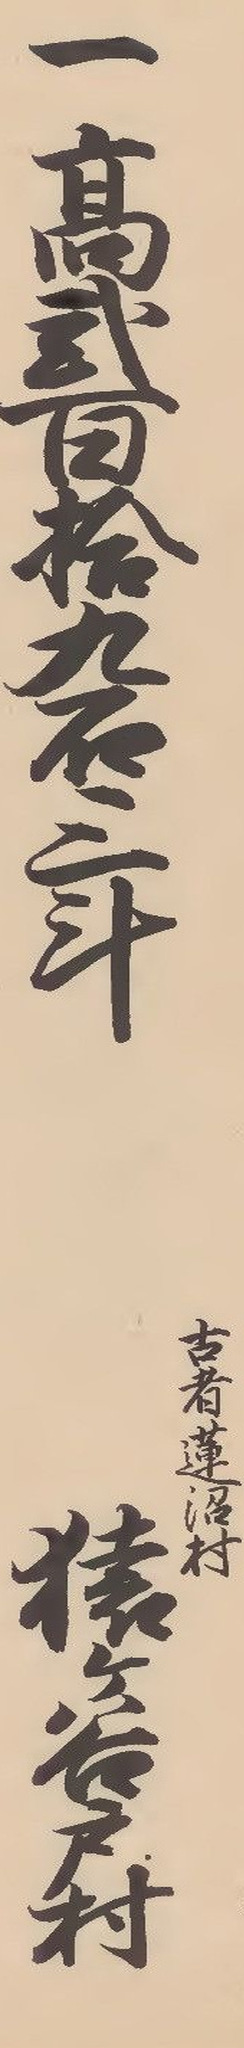一高弐百拾九石三斗猿ヶ谷戸村
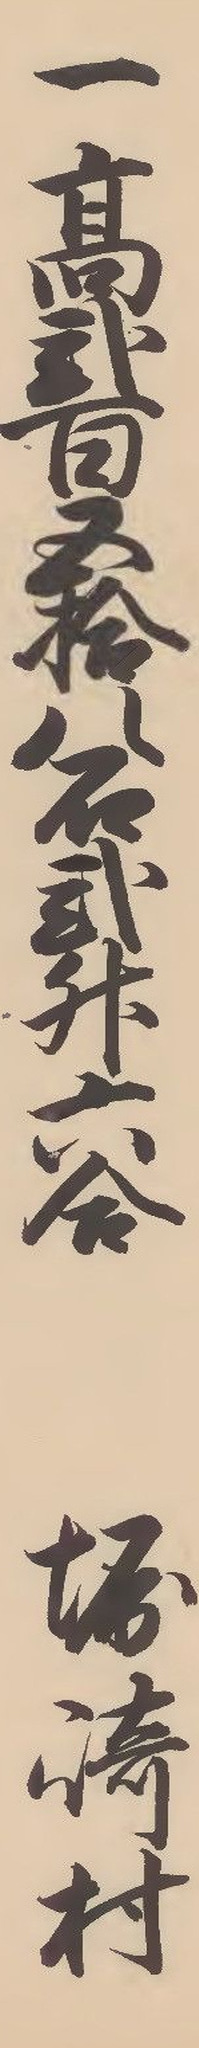一高弐百五拾八石弐升六合堀崎村
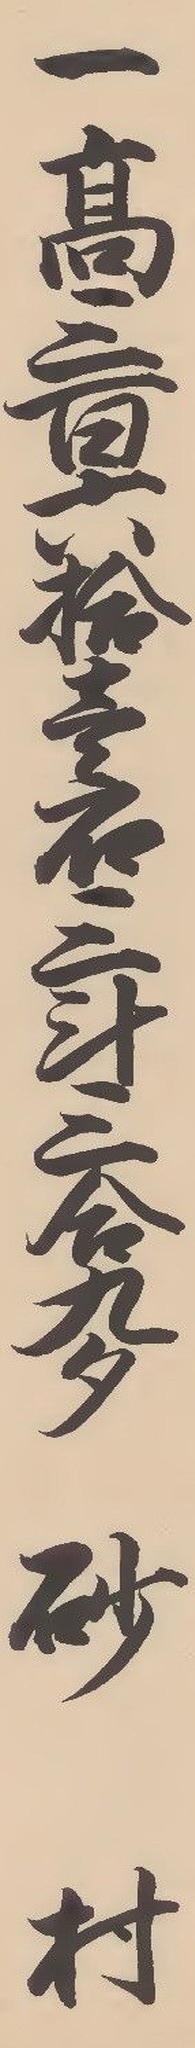一高三百六拾壱石三斗三合九勺砂村
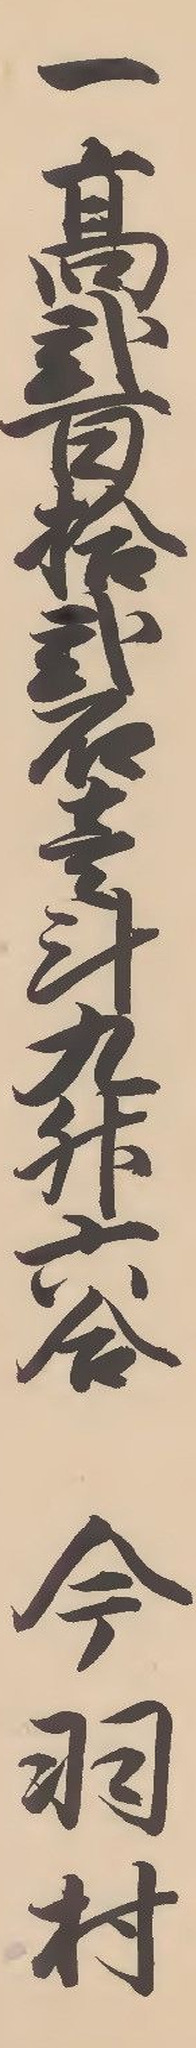一高弐百拾弐石壱斗九升六合今羽村
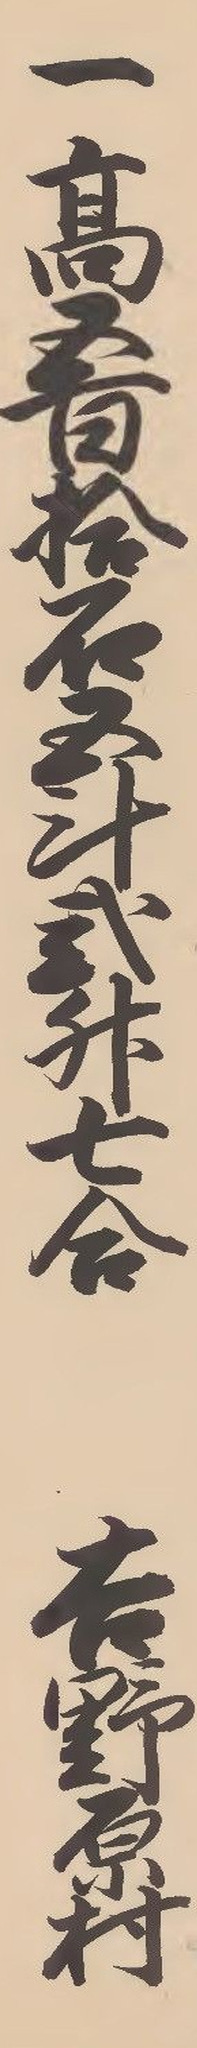一高五百拾石五斗弐升七合吉野原村
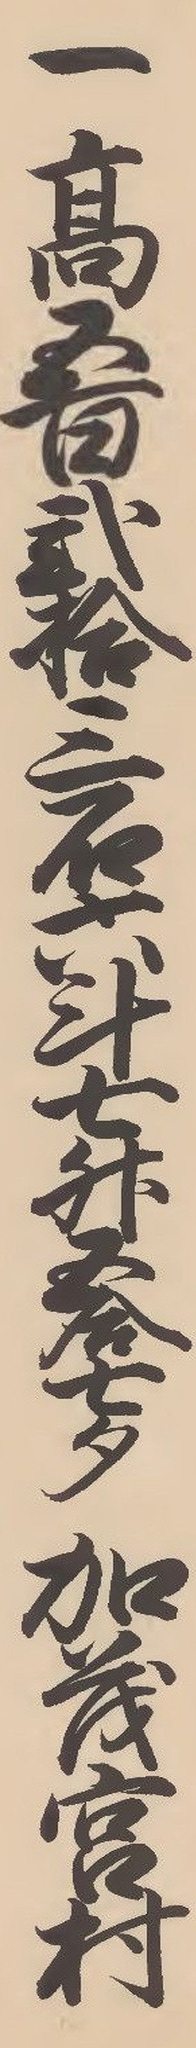一高五百弐拾三石六斗七升五合七勺加茂宮村
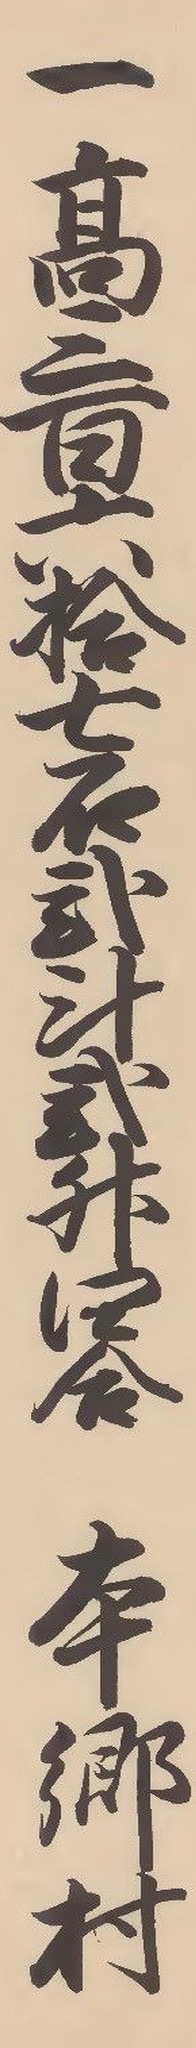一高三百六拾七石弐斗弐升四合本郷村
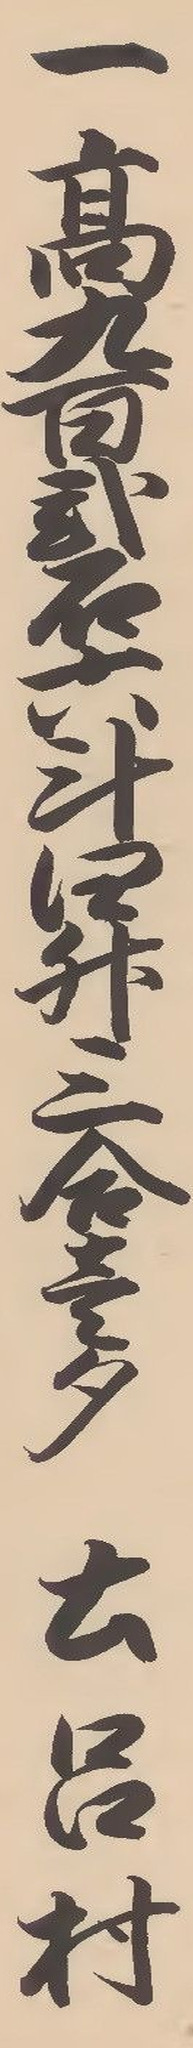一高九百弐石六斗四升三合壱勺土呂村

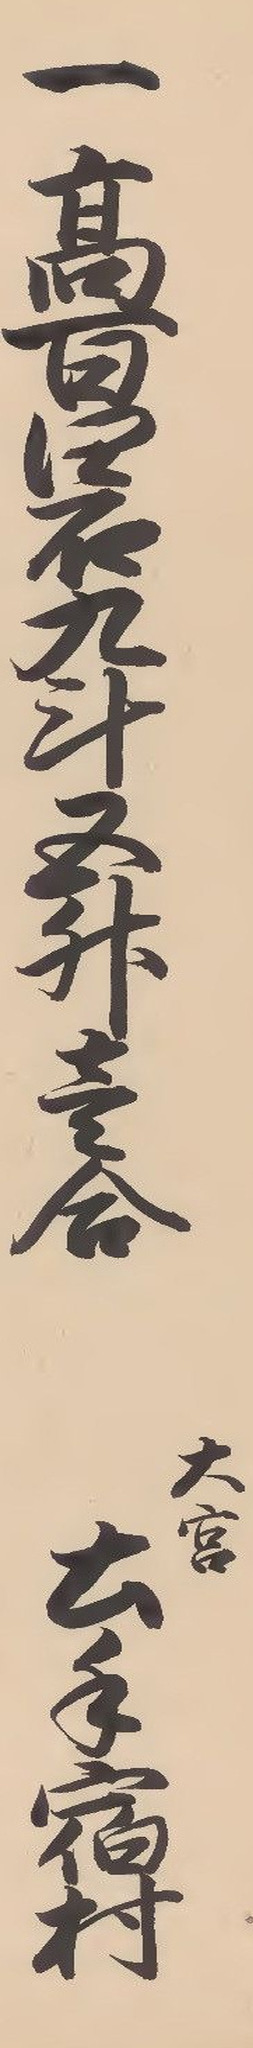一高百四石九斗五升壱合土手宿村
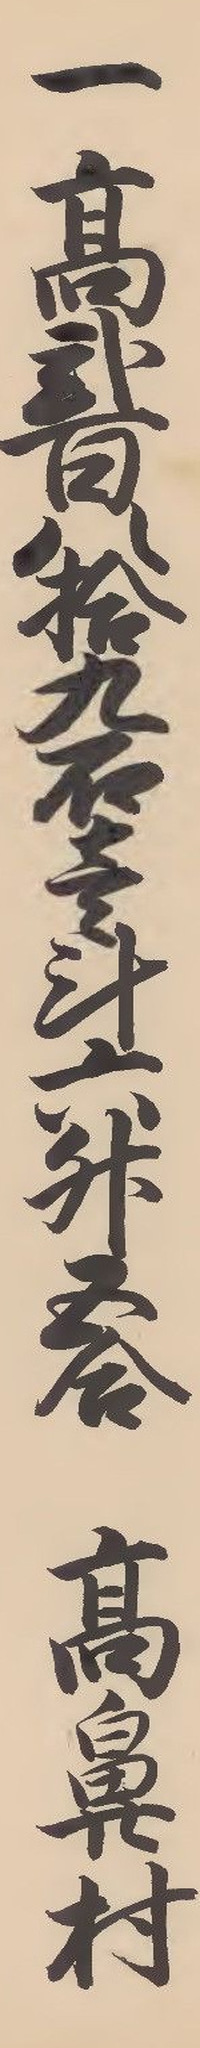一高弐百八拾九石壱斗六升五合高鼻村
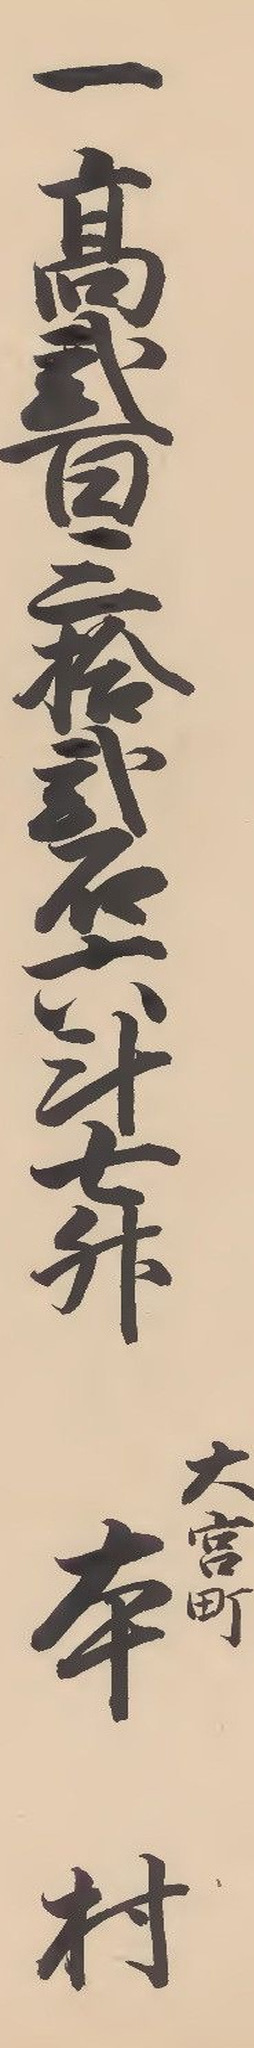一高弐百三拾弐石六斗七升本村
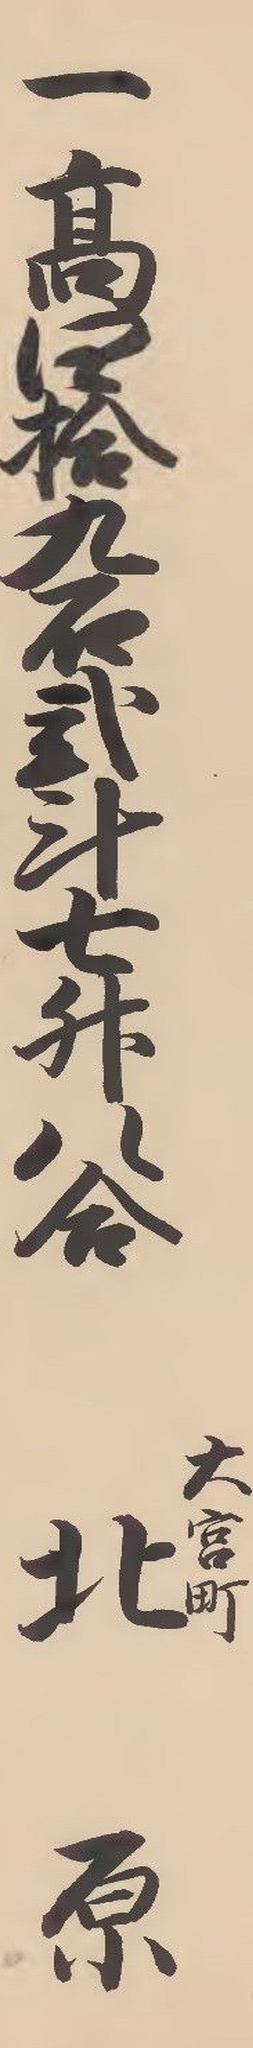一高四拾九石弐斗七升八合北原
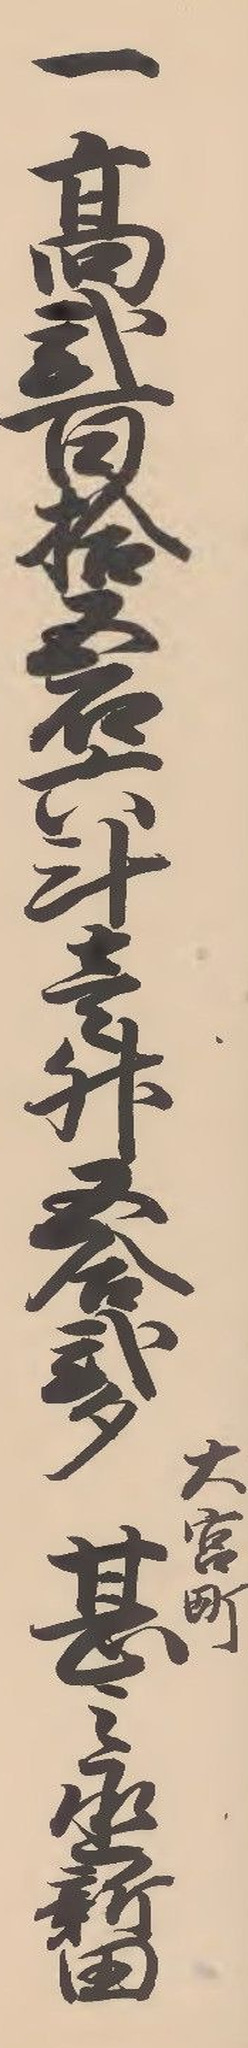一高弐百拾五石六斗壱升五合弐勺甚之丞新田
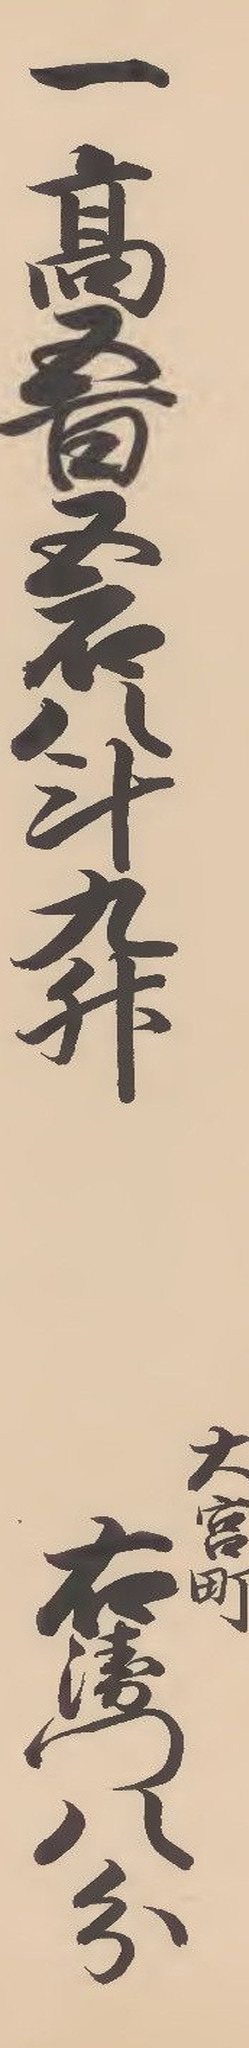一高五百五石八斗九升右衛門八分
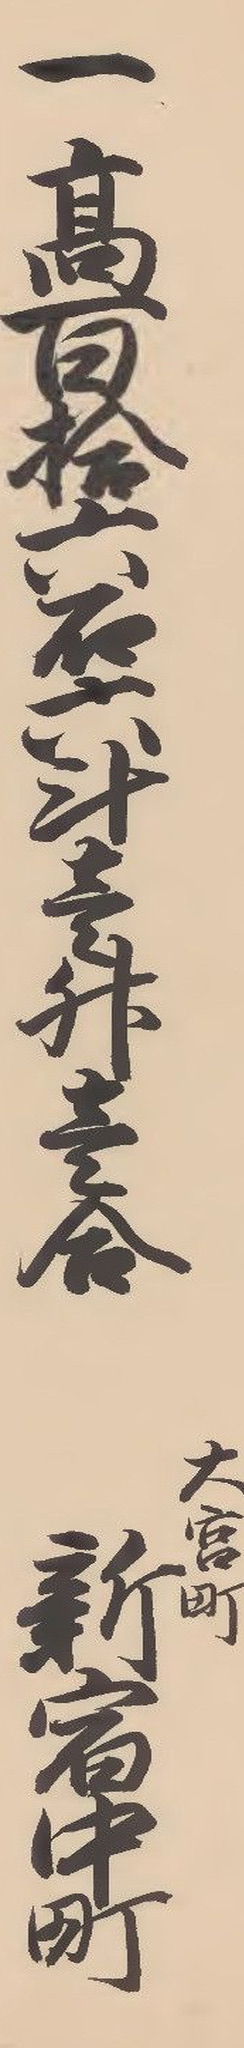一高百拾六石六斗壱升壱合新宿中町
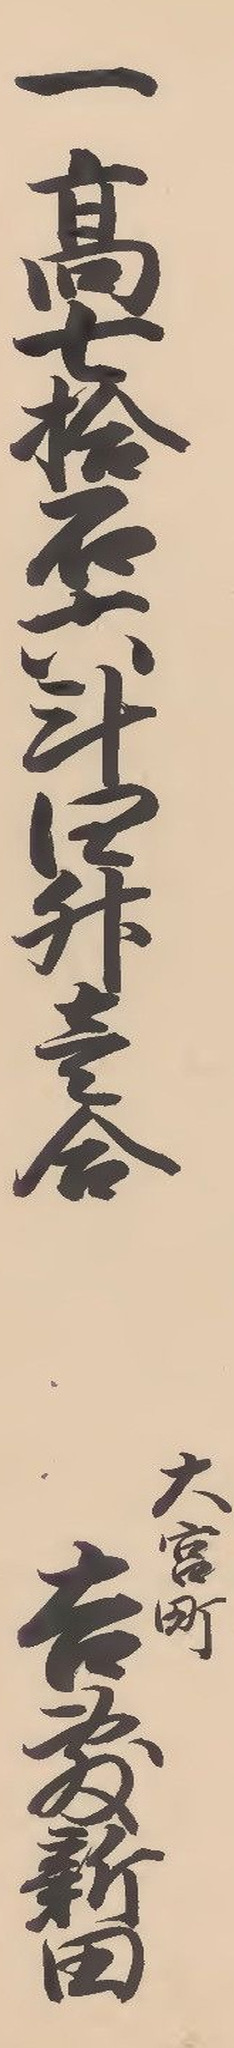一高七拾石六斗四升壱合吉敷新田
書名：武蔵国郷帳　下
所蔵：国立公文書館 National Archives of Japan
